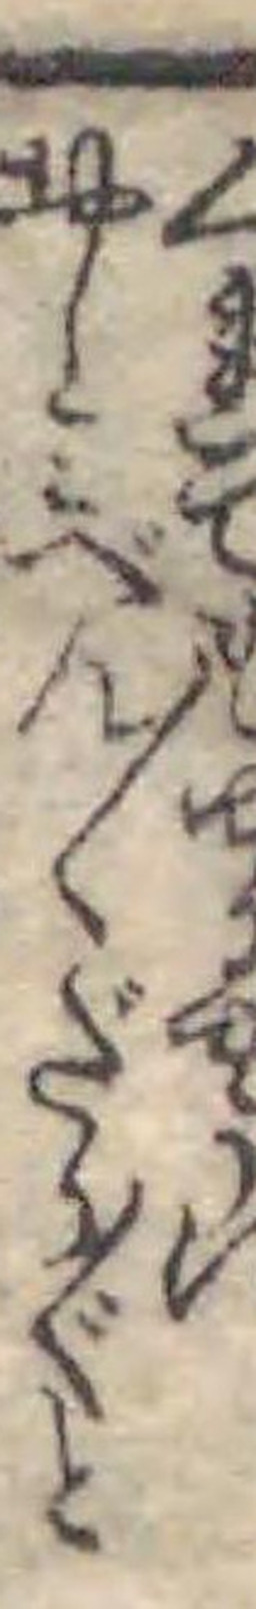おしみべん〳〵だら〴〵と
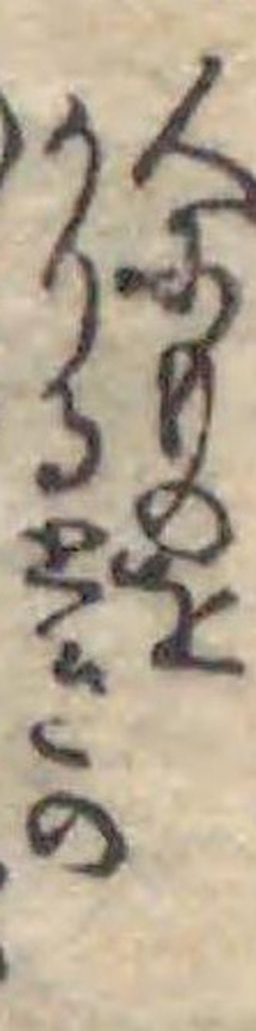かりるときの
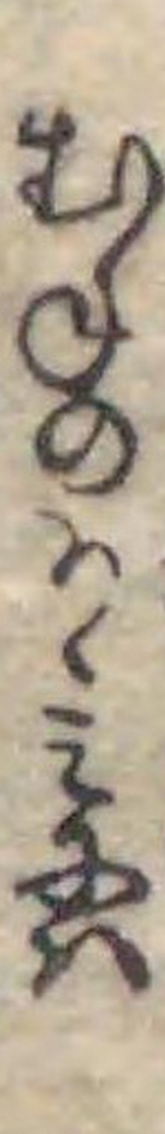むねのかゝみには
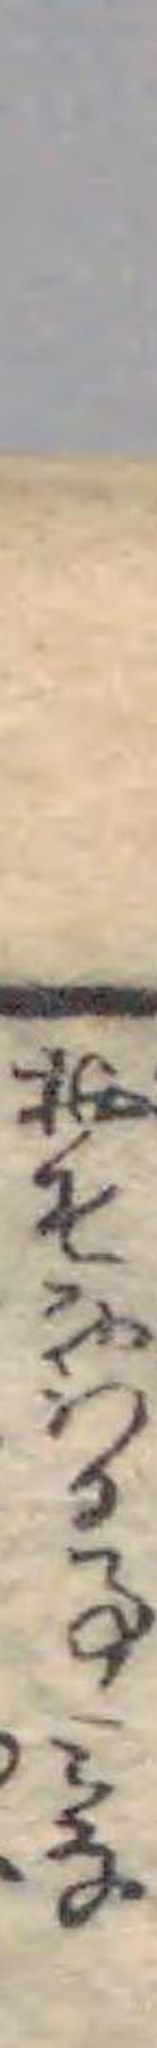おそはる事みな
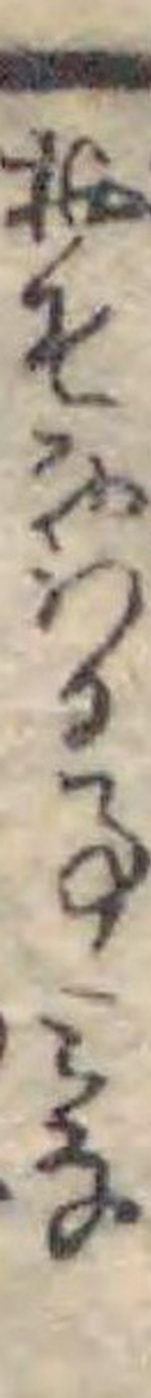おそはる事みな
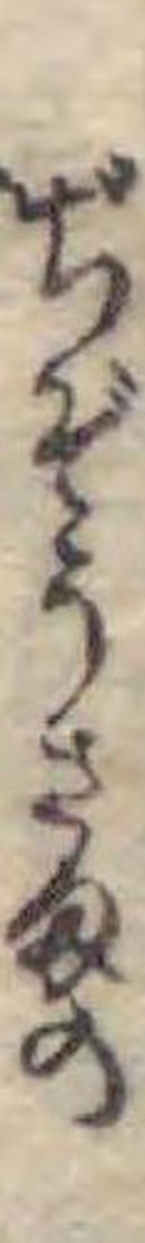ぢぞうさまの
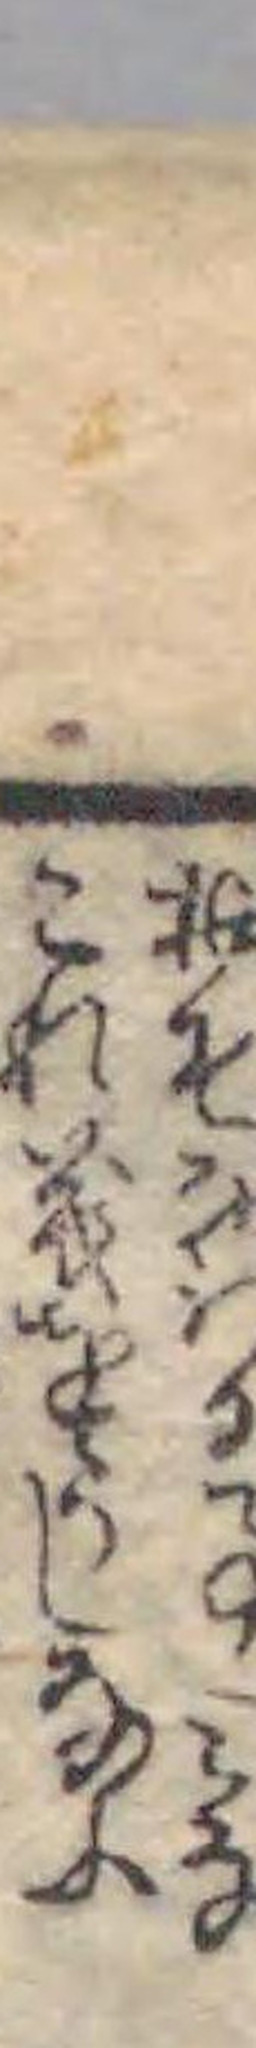これ義をうしなふ
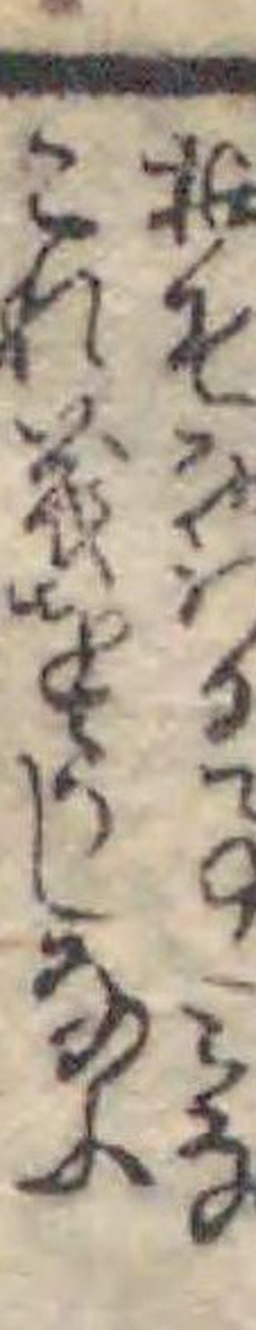これ義をうしなふ
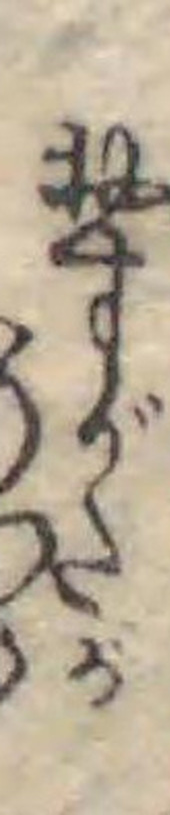おすがたが
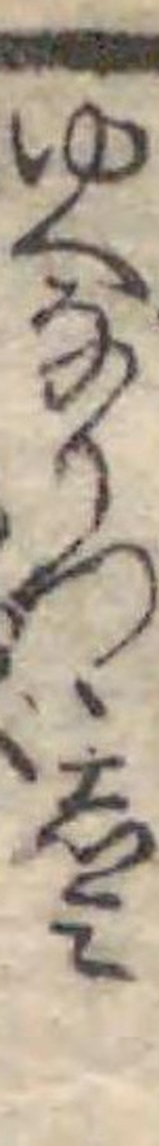ゆへなりつゝしみ
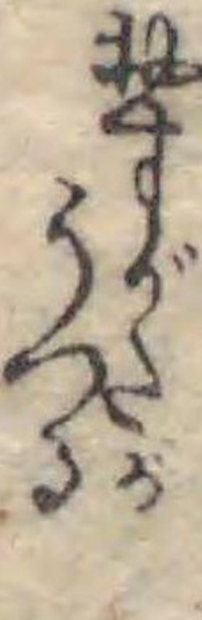うつる
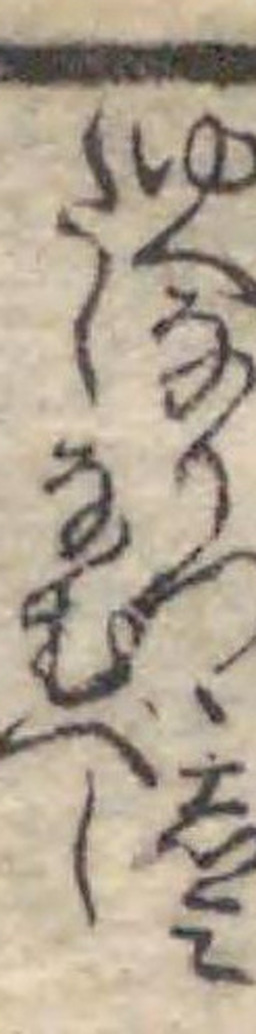たしなむべし
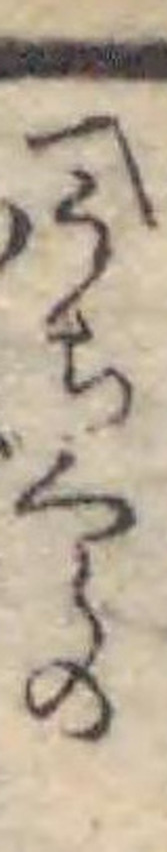〽うちくらの
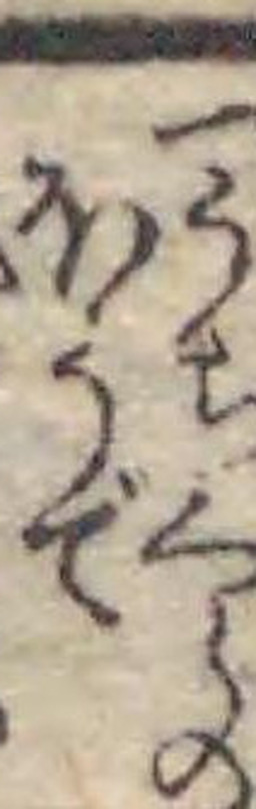ほうで
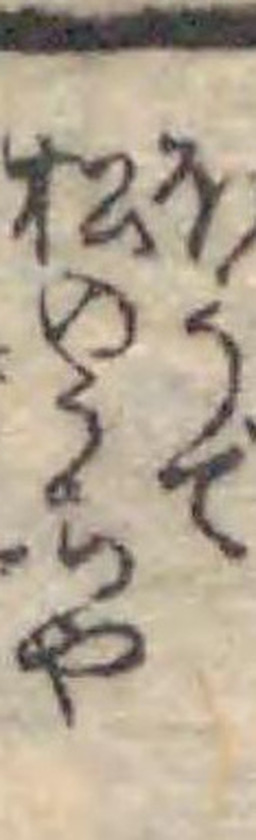松のうちや
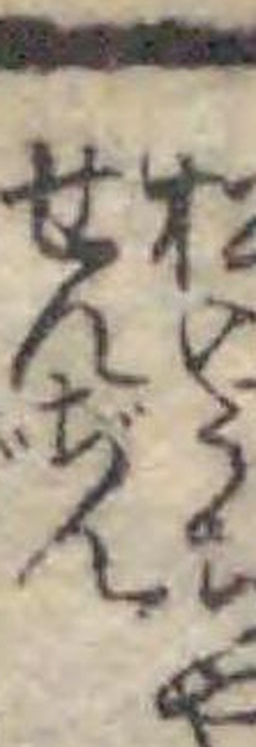せんぢん
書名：人心鏡写絵 : 3巻
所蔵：国立国会図書館 National Diet Library, JAPAN
